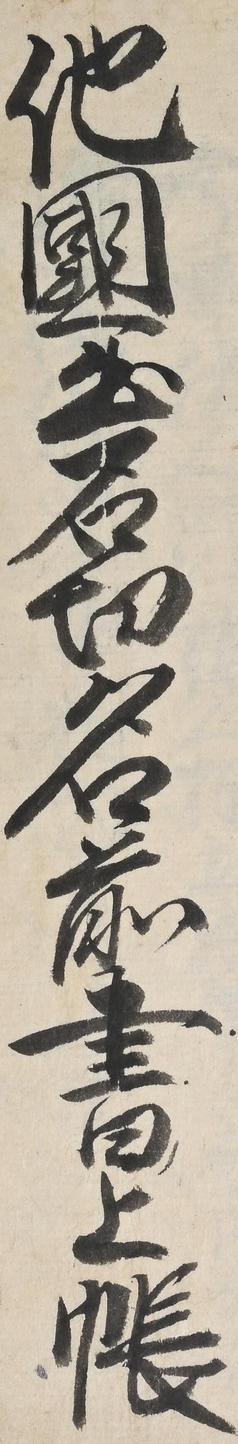他国出石切名前書上帳

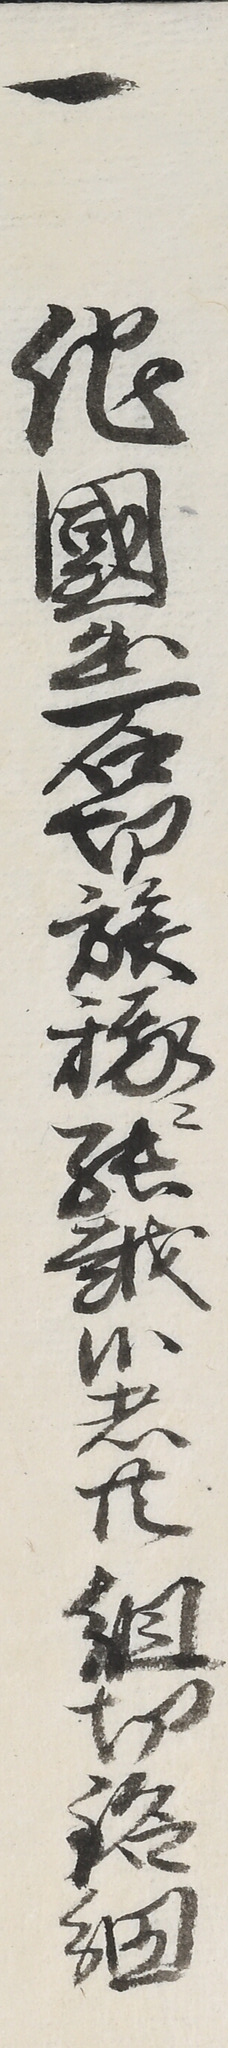一他国出石切旅稼ニ罷越候者共組切銘細
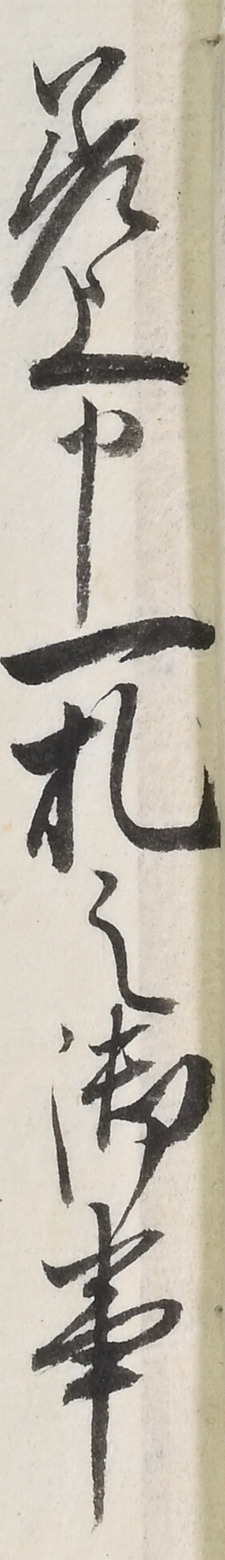差上申一札之御事
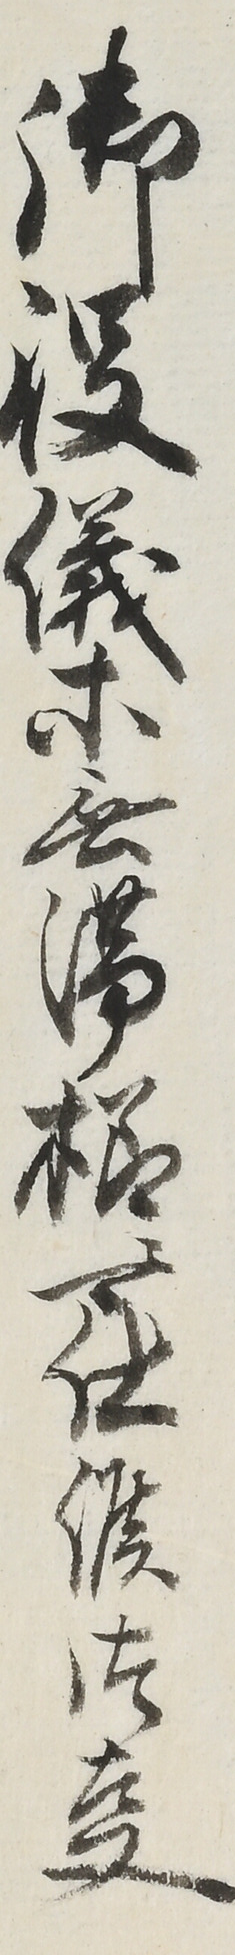御役儀等無滞様ニ可仕候御事
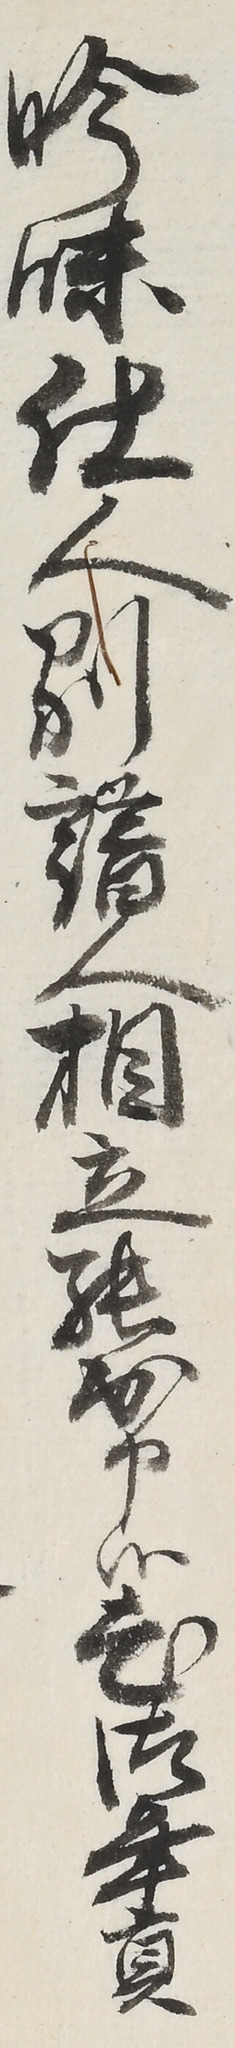吟味仕人別諸人相立罷出申候尤御年貢
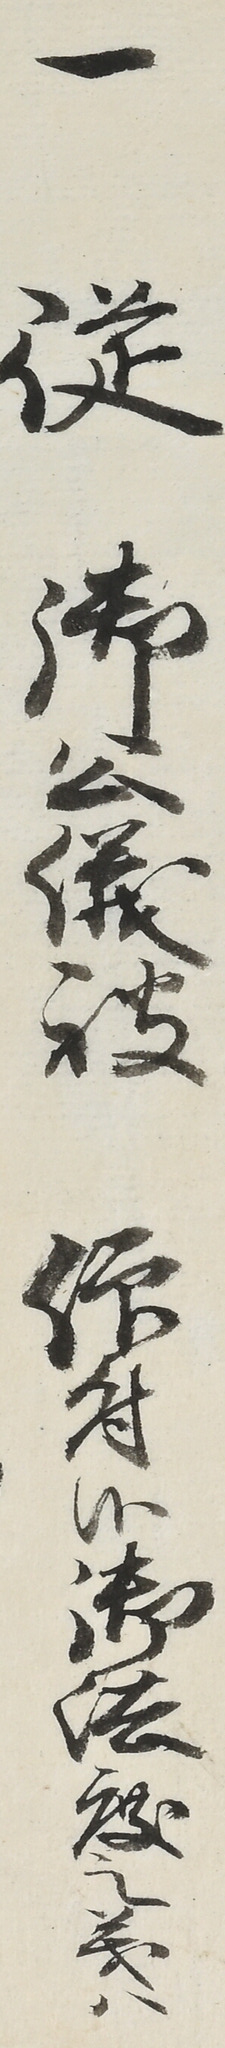従御公儀被仰付候御法度之義ハ
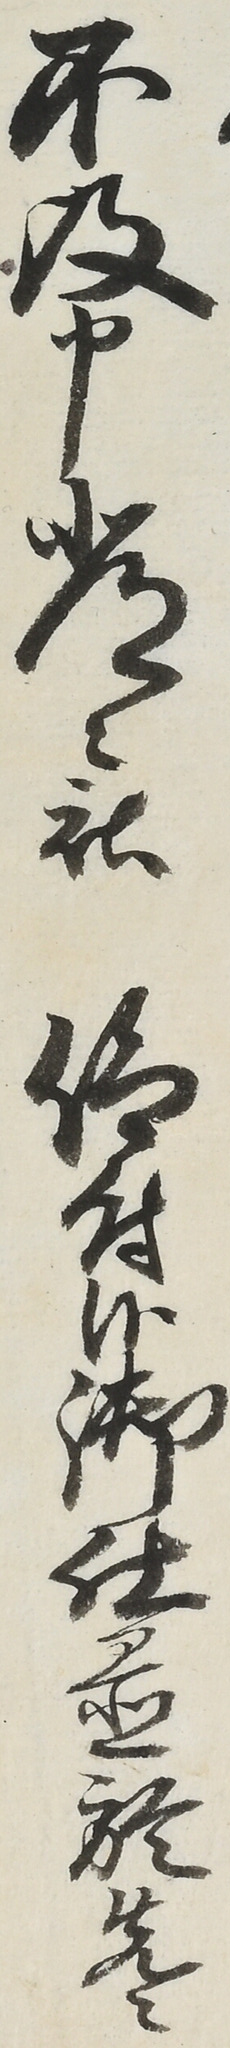不及申常々被仰付候御仕置於先々
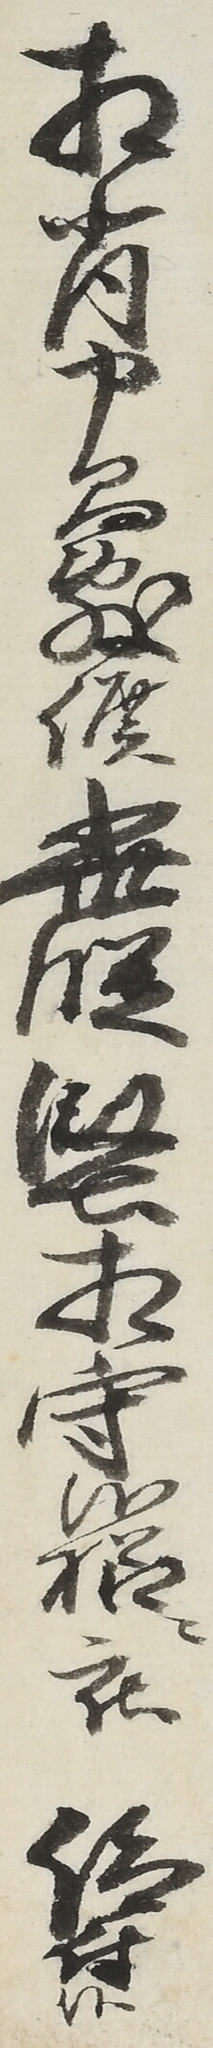相背申間敷候此段堅相守候様ニ被仰付候

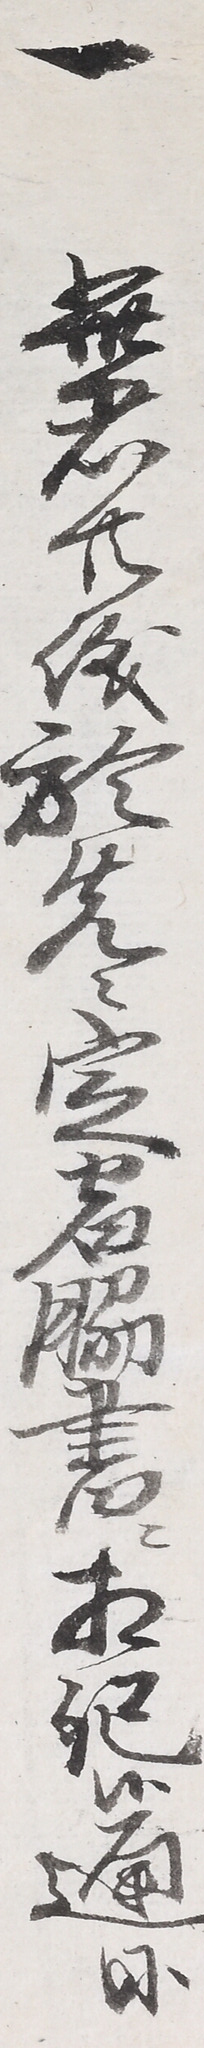一此者共儀於旅先ニ定宿脇書ニ相記候通りに
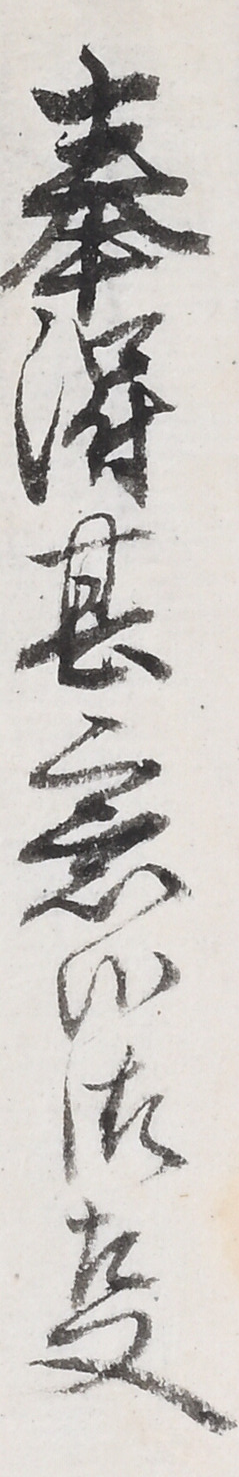奉得其意候御事
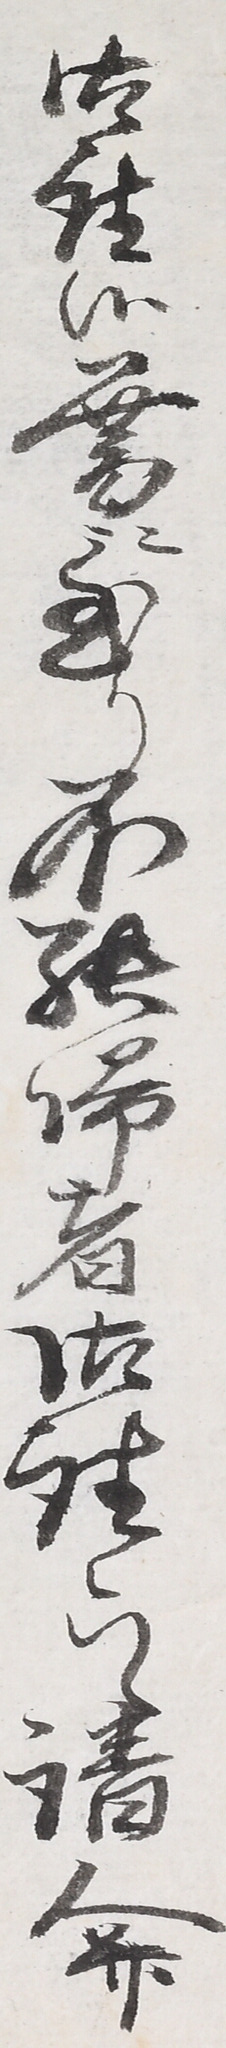御座候暮ニ至り不罷帰者御座候ハヽ請人并
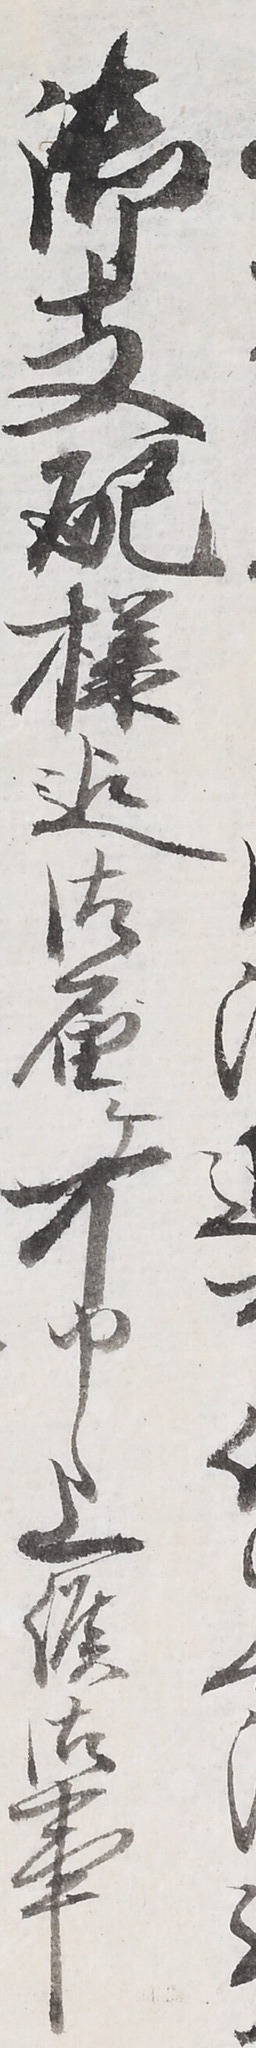御支配様迄御届ヶ可申上候御事
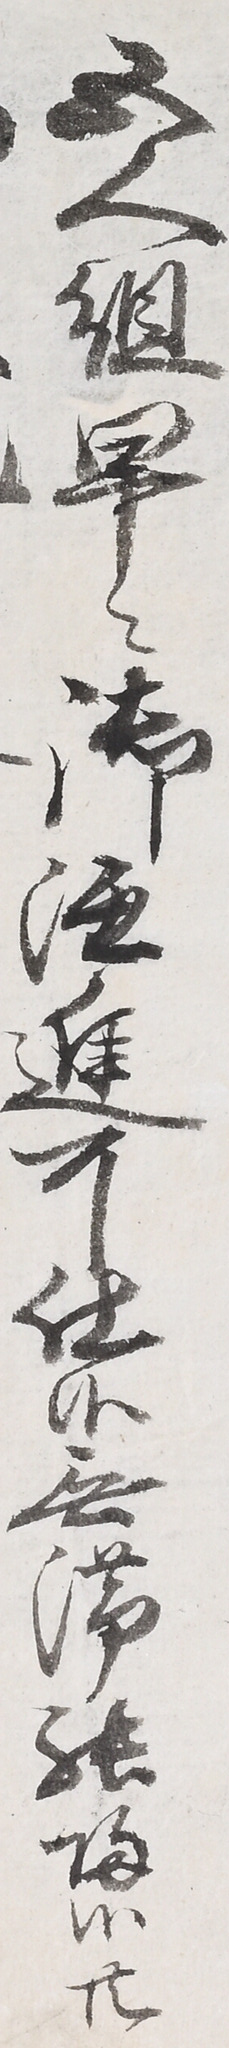五人組早々御注進可仕候無滞罷帰候共
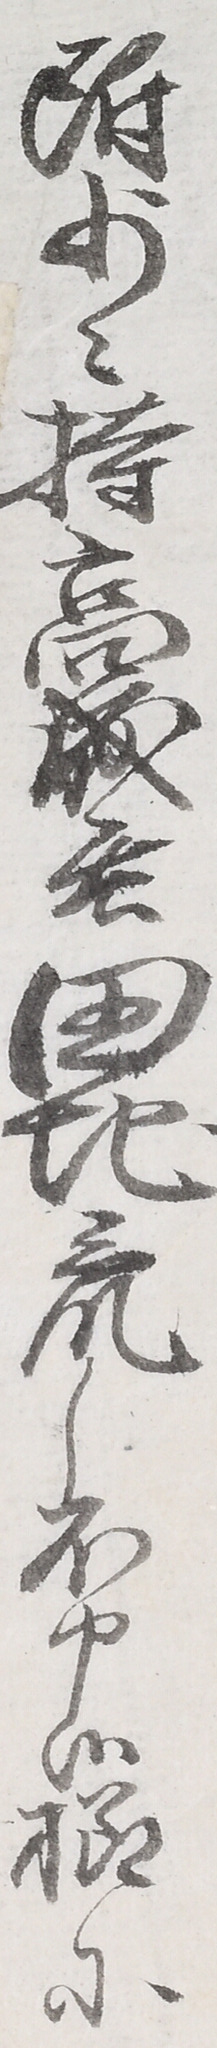附少々持高成共田地荒し不申候様に
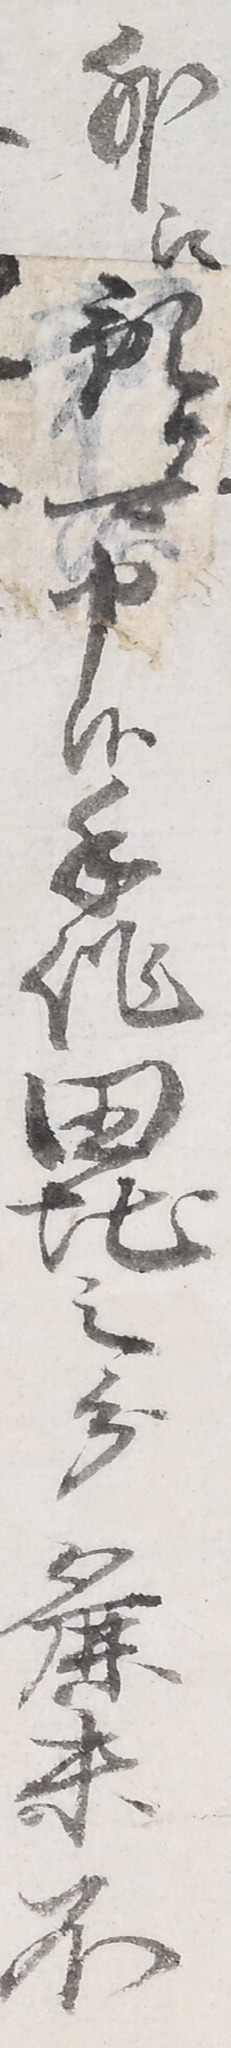外江預ヶ可申候手作田地之分麤末不
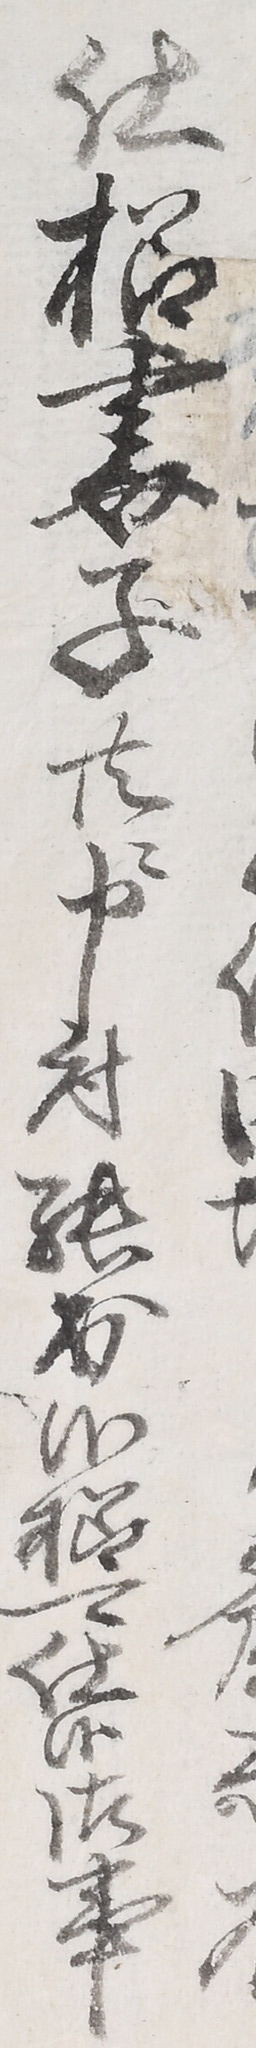仕様妻子共ニ申付罷出候様可仕候御事
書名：天保十四癸卯年正月他國出石切名前書上帳控
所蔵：伊那市立高遠町図書館・合同会社AMANE
